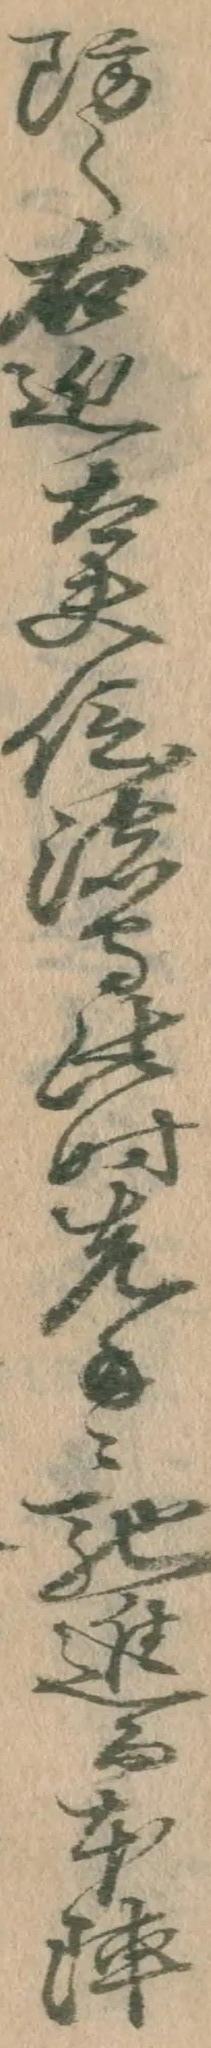防く右近太夫信濃守此時先手に馳進而本陣
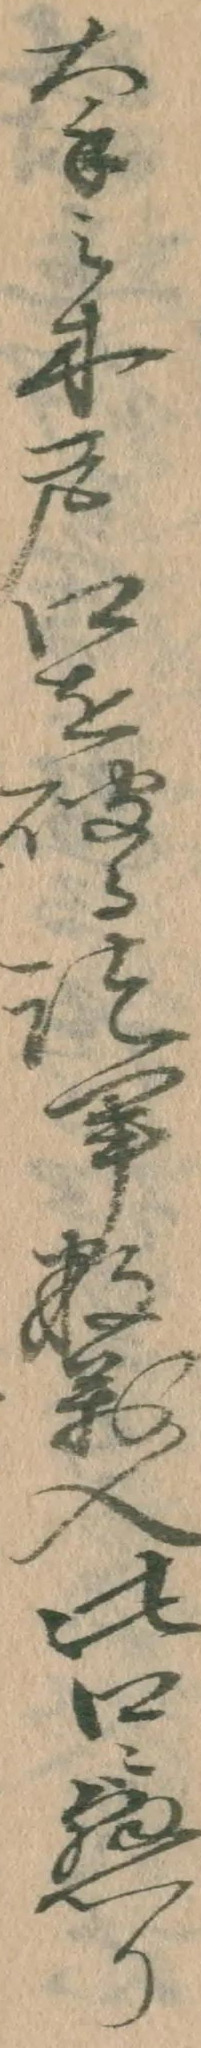大手之木戸口を破る諸軍数万人此口に懸り
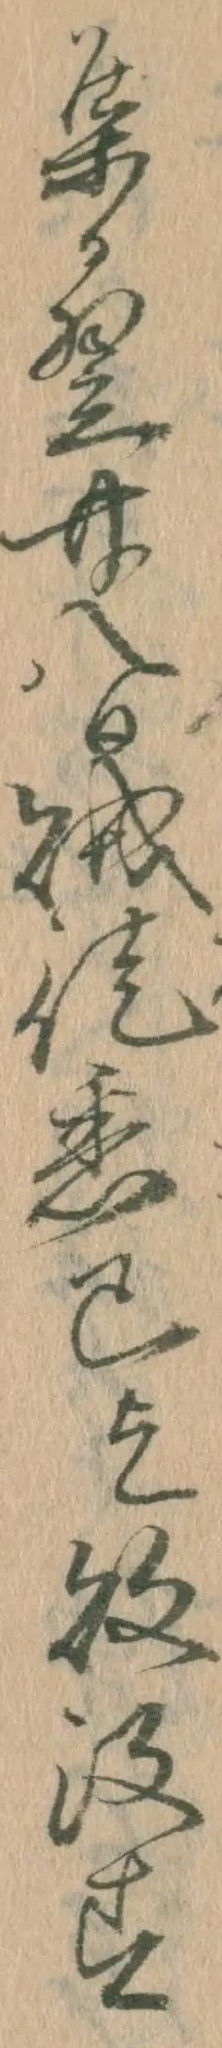集り翌廿八日賊徒悉己斗敗没春
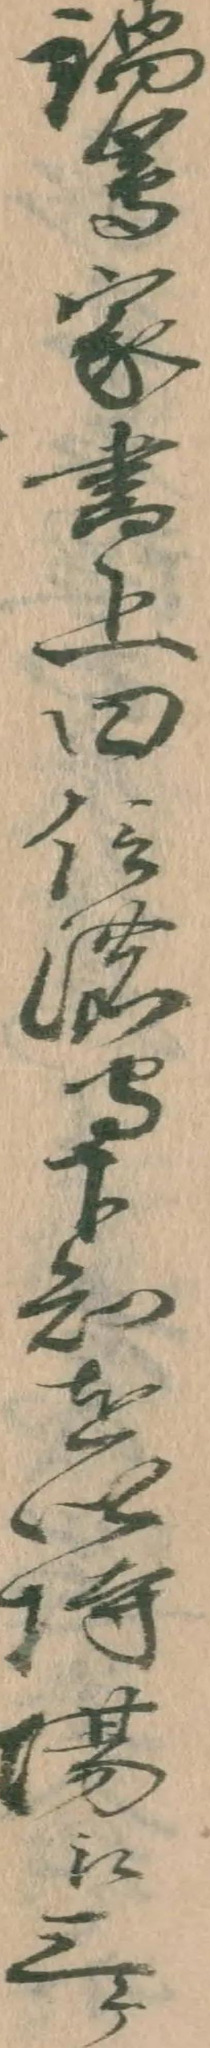鍋島家書上曰信濃守下知を仕持場江三け
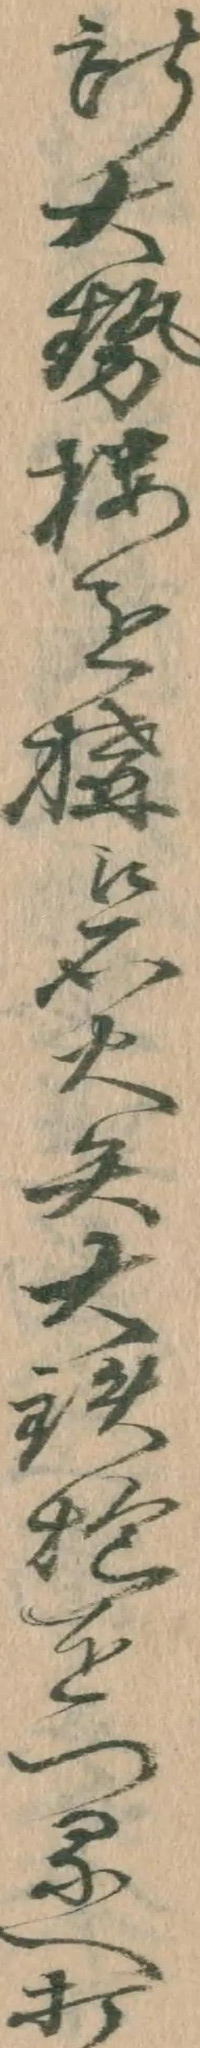所大勢樓を構江石火矢大鉄砲をつ累へ打
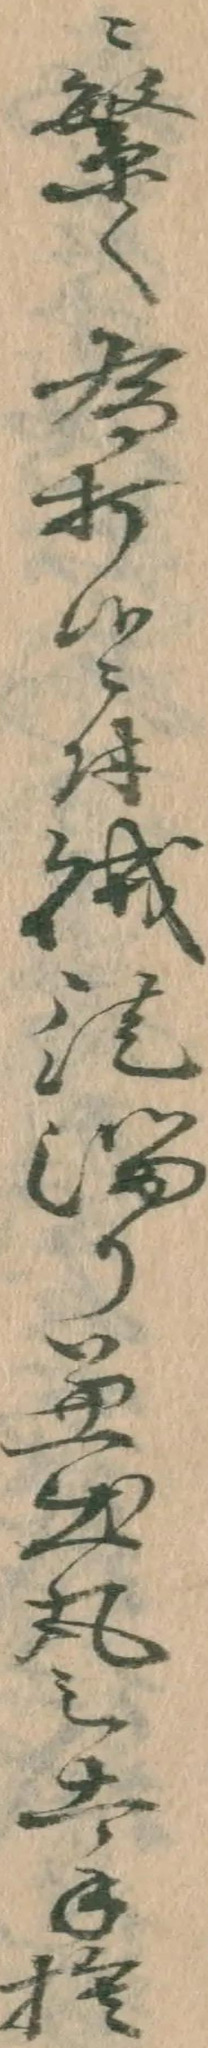に繁く為打候に付賊徒溜り兼出丸之土手捨
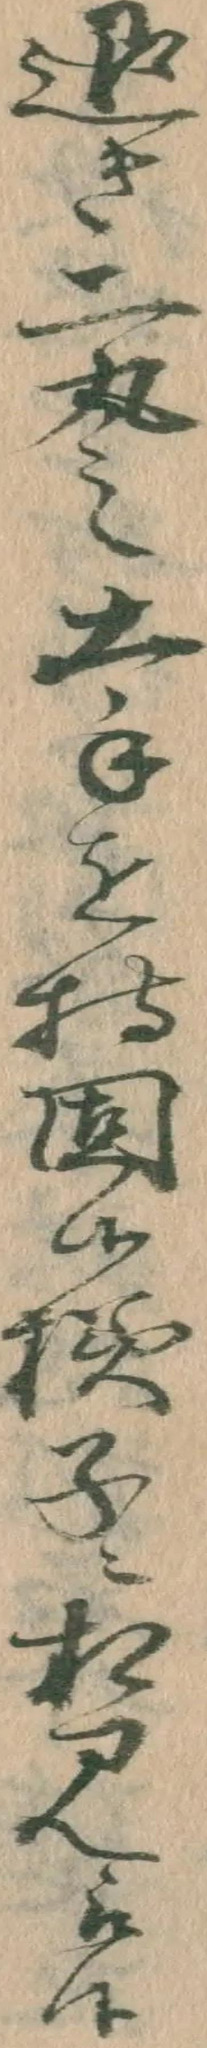退き二丸之土手を持固候様子に相見江候
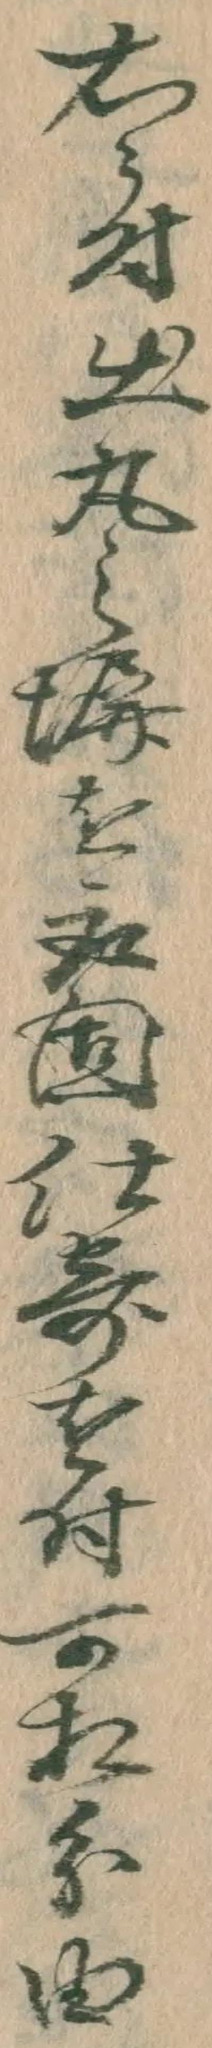右に付出丸之塀を取囲仕寄を付可相分由
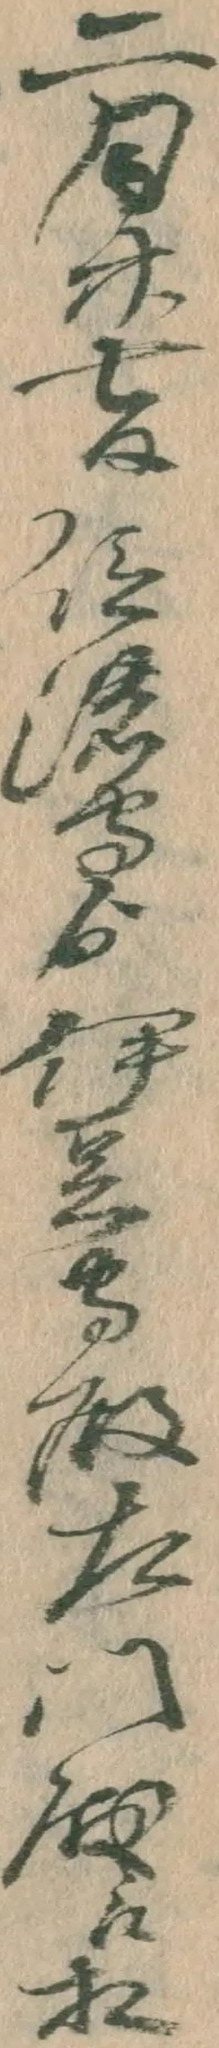二月廿七日信濃守ゟ伊豆守殿左門殿江相
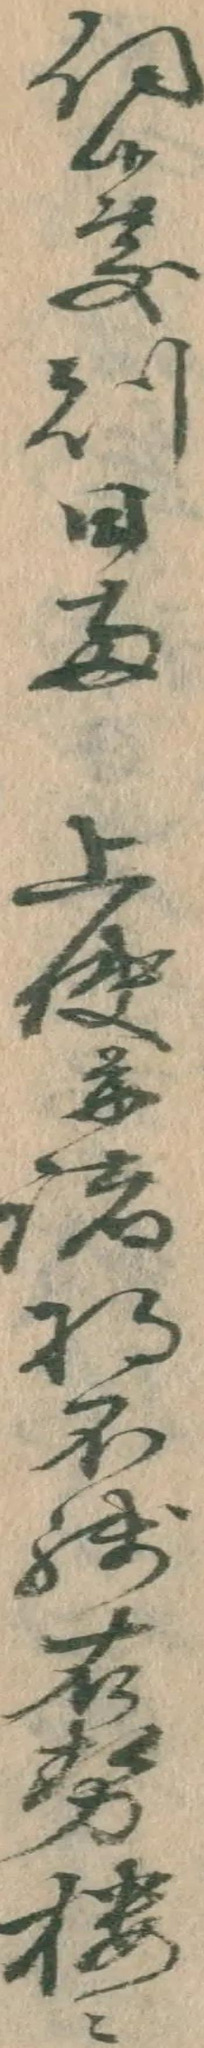伺候處則日両上使幷諸将不残右勢樓に
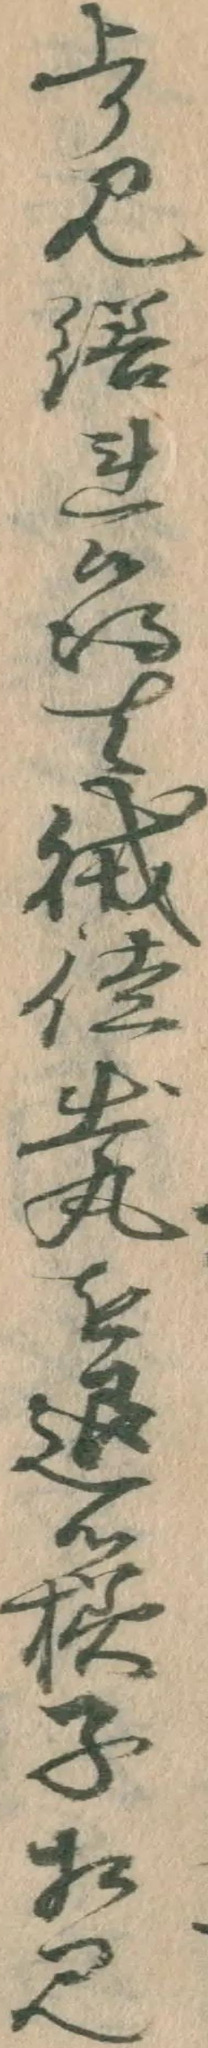上り見繕連候得者賊徒出丸を退候様子相見
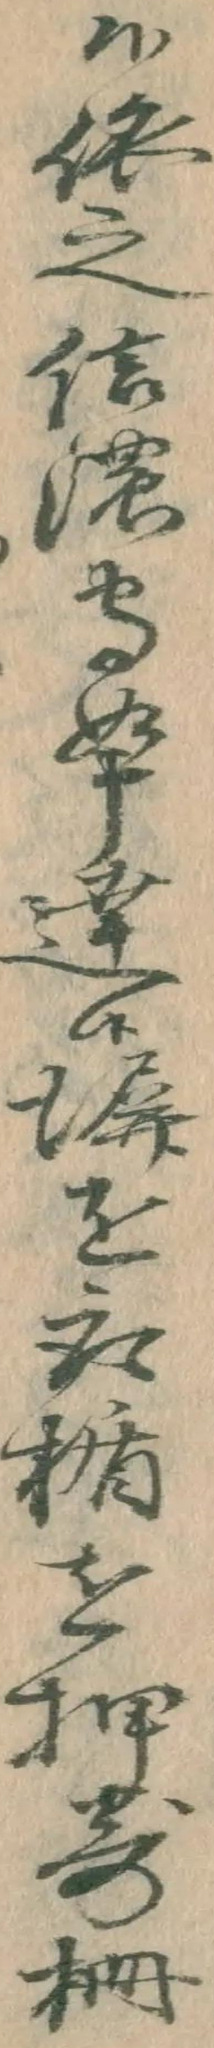候依之信濃守如申達候塀を取楯を押寄柵
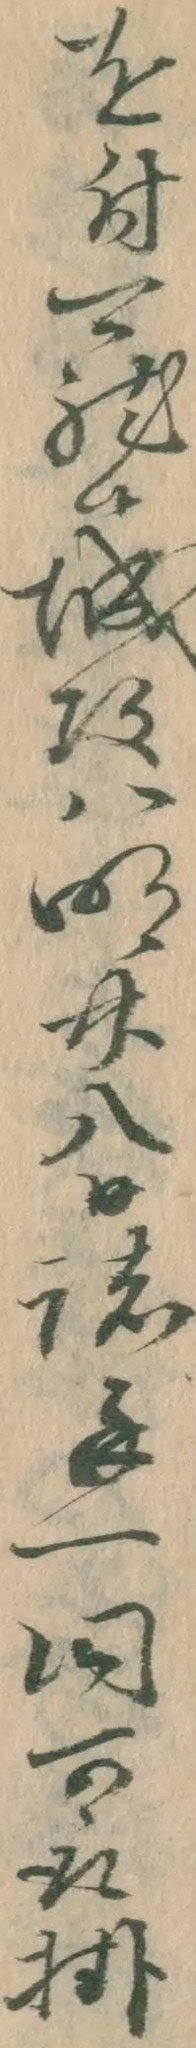を付可然る候城攻は明廿八日諸手一同可取掛

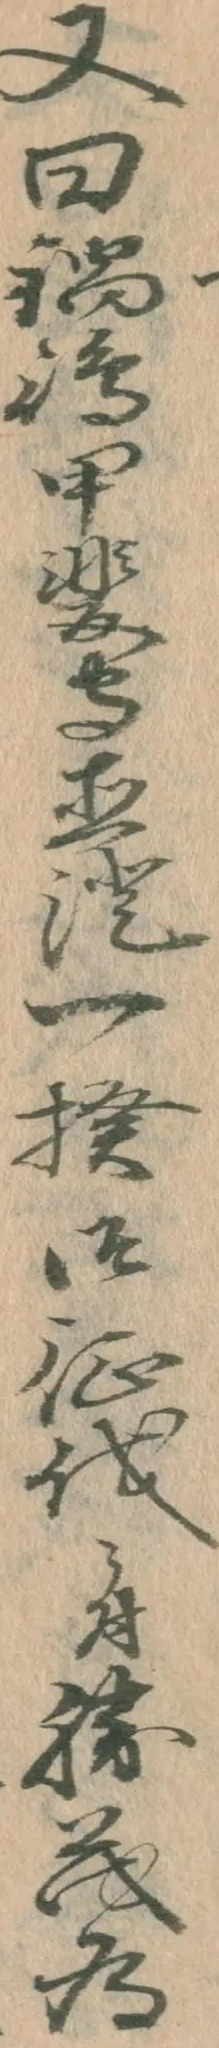又曰鍋島甲斐守直純一揆御征伐に付勝茂為
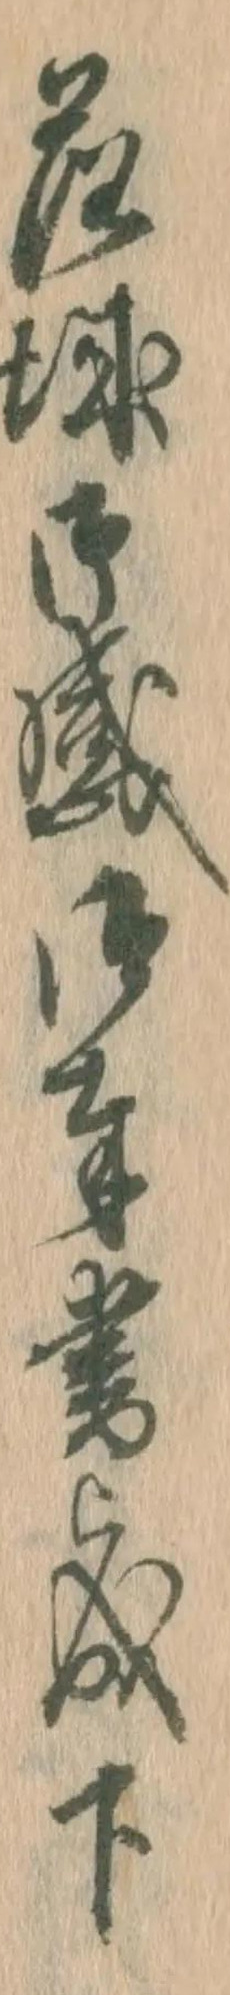落城御感御奉書被成下
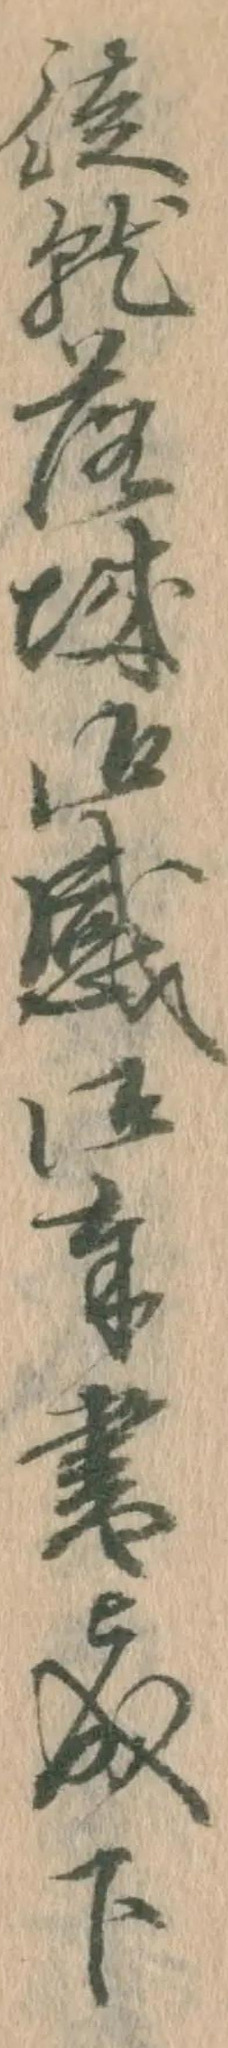徒就落城御感御奉書被成下
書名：切支丹御退治記 49巻. [8]
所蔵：国立国会図書館 National Diet Library, JAPAN
